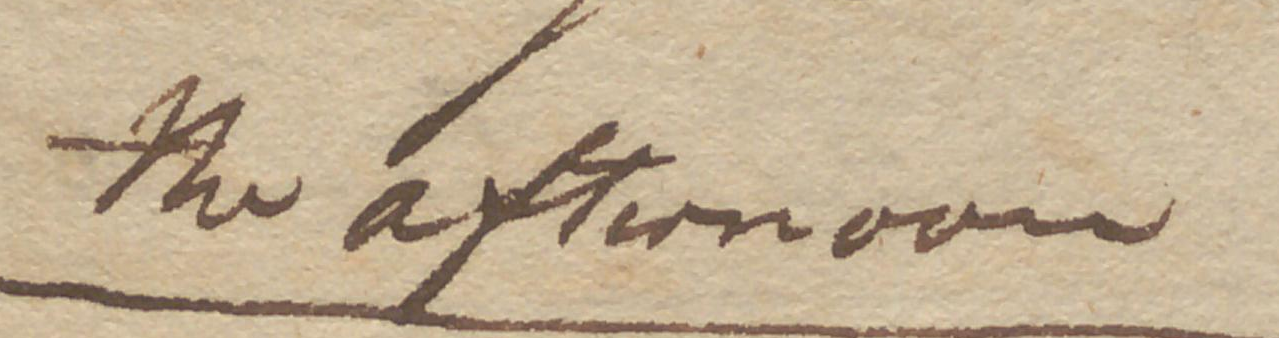the afternoon
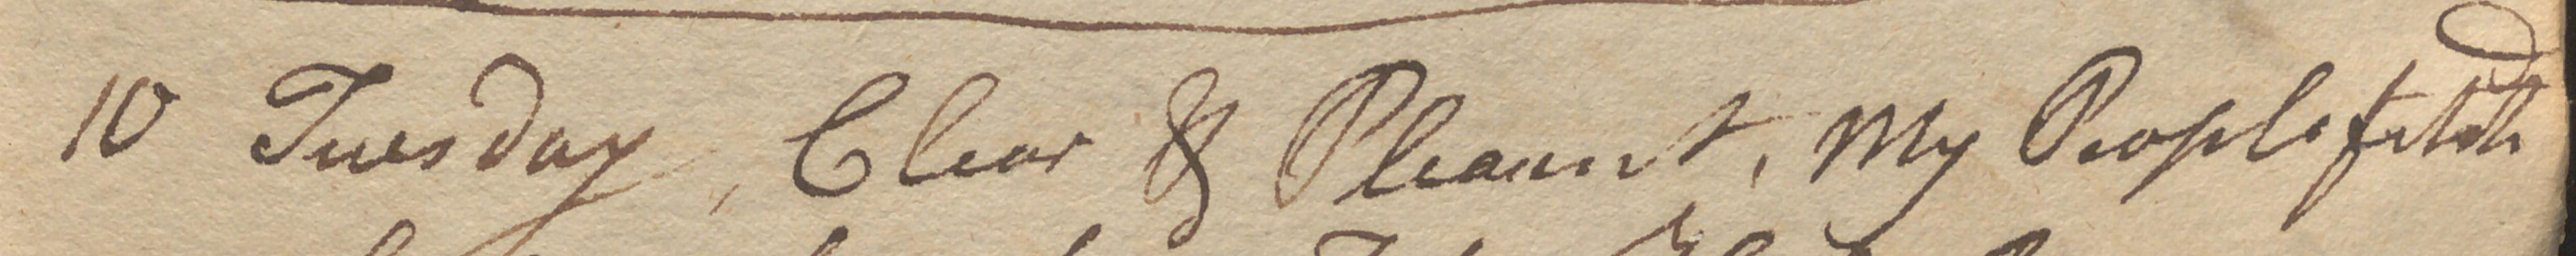10 Tuesday Clear & Pleasent, My People fetch^d
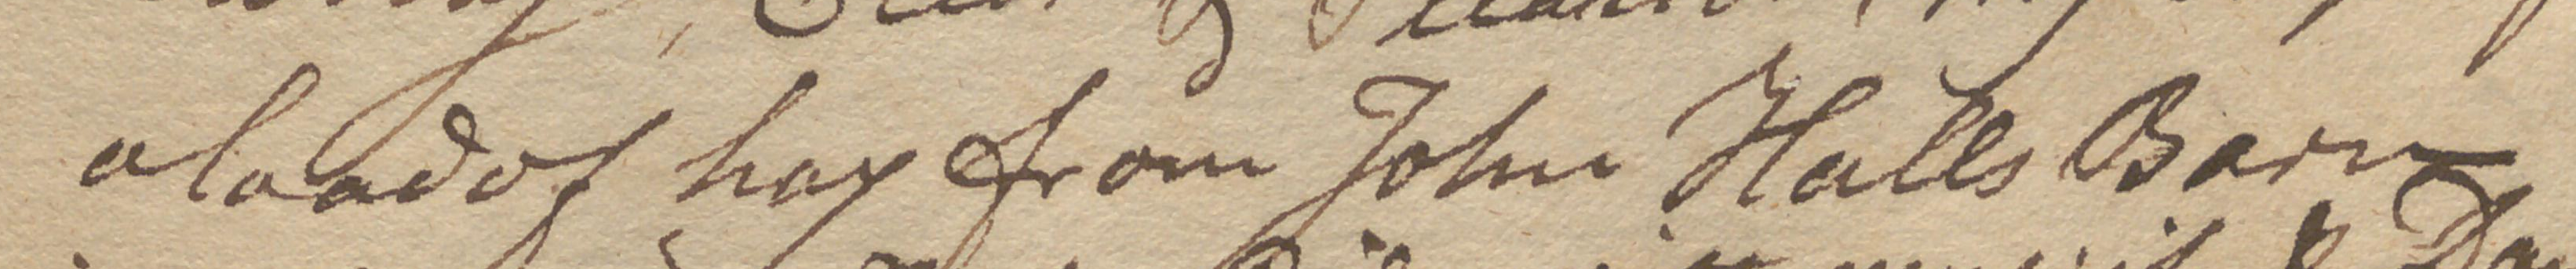a load of hay from John Halls Barn
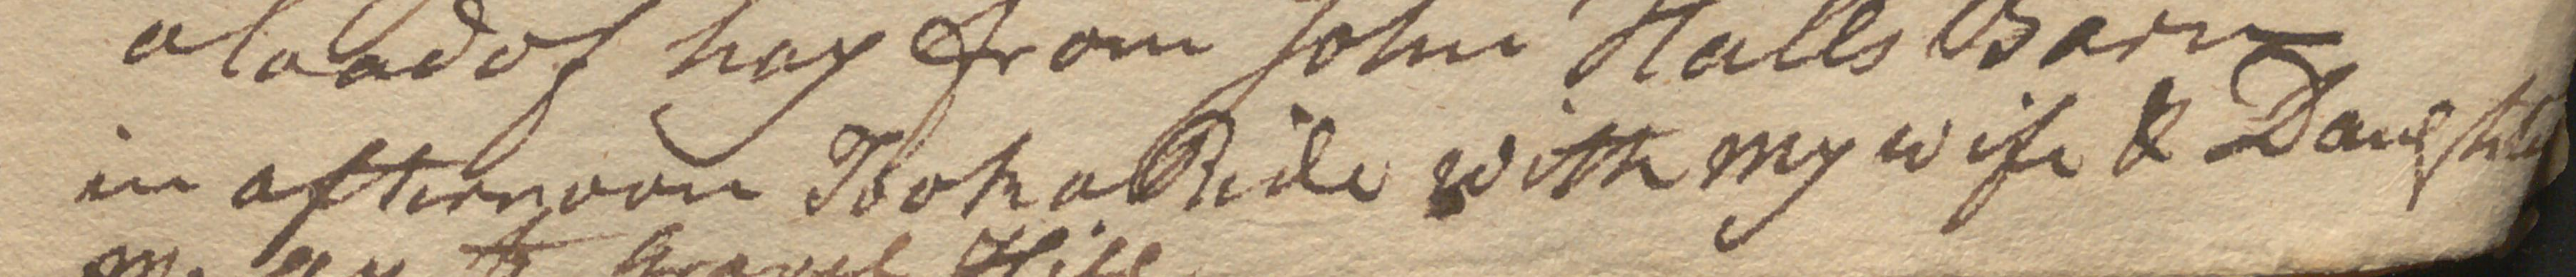in afternoon Took a Ride with my wife & Daught
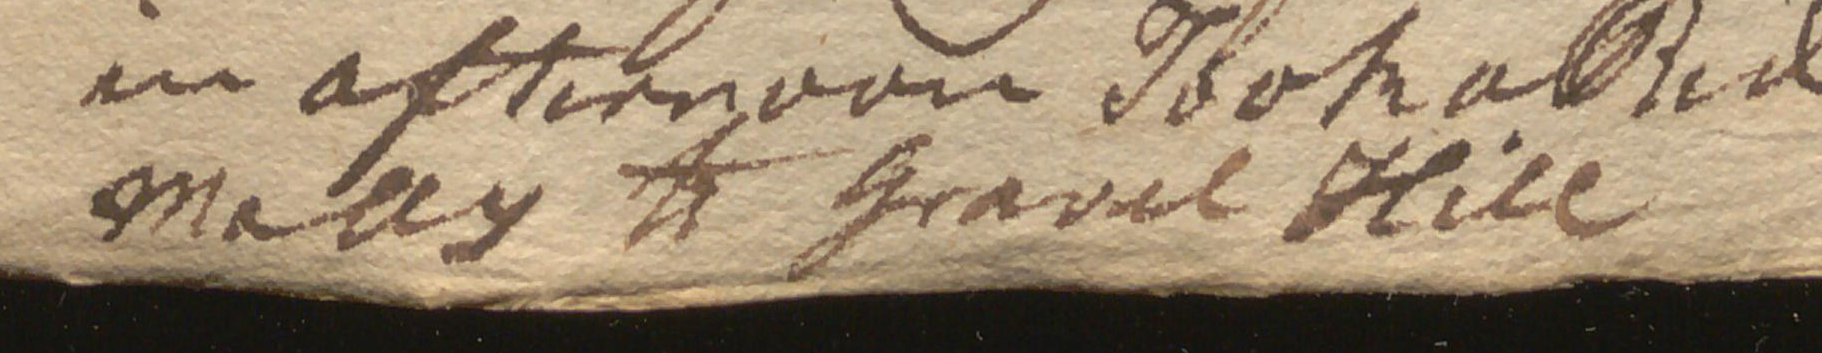Molly to Gravel Hill
